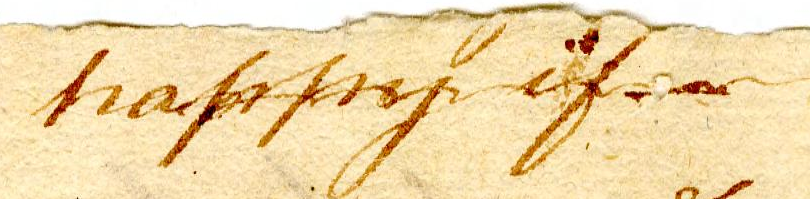happy if-
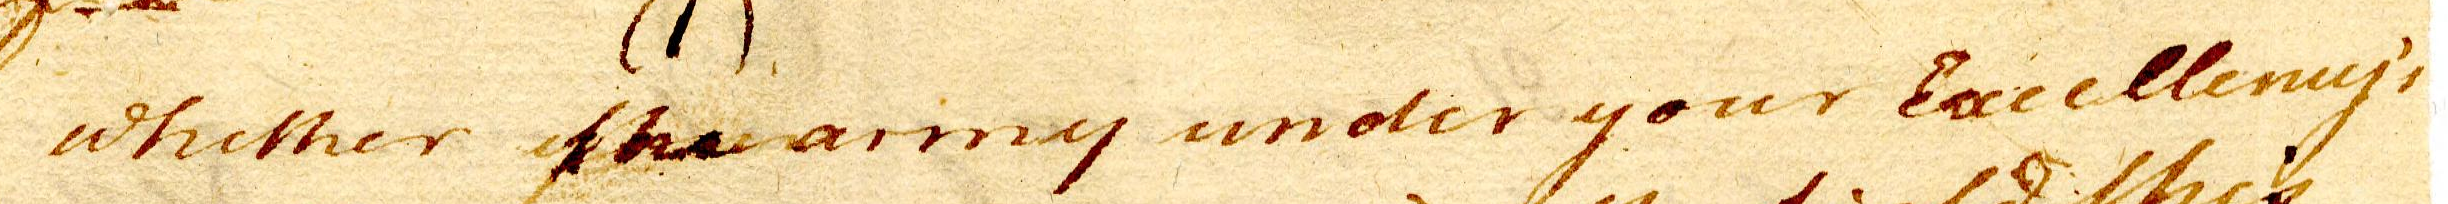whether the army under your Excellency's
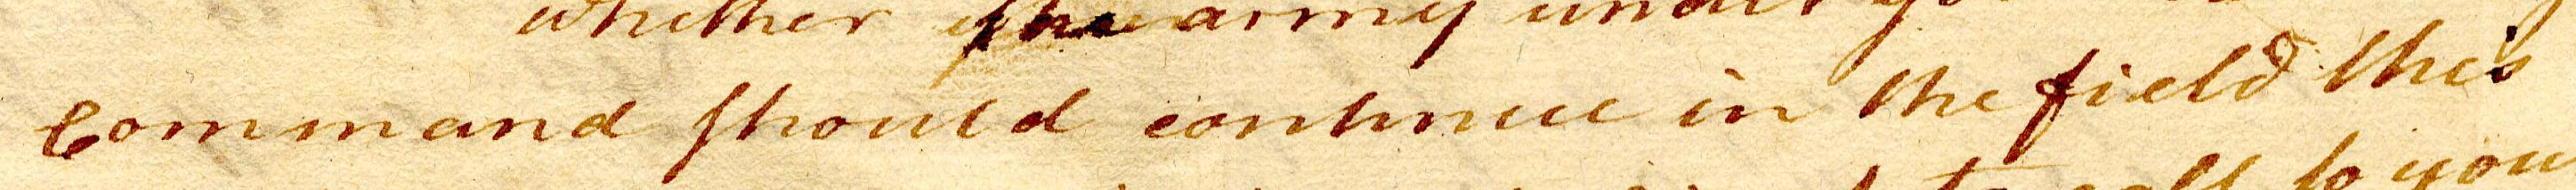Command should continue in the field this
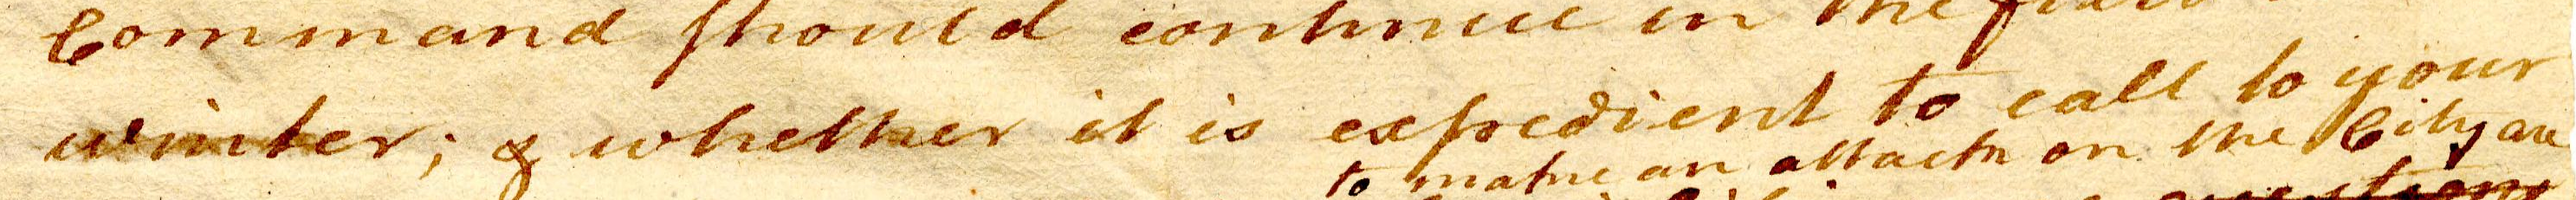winter; & whether it is expedient to call to your
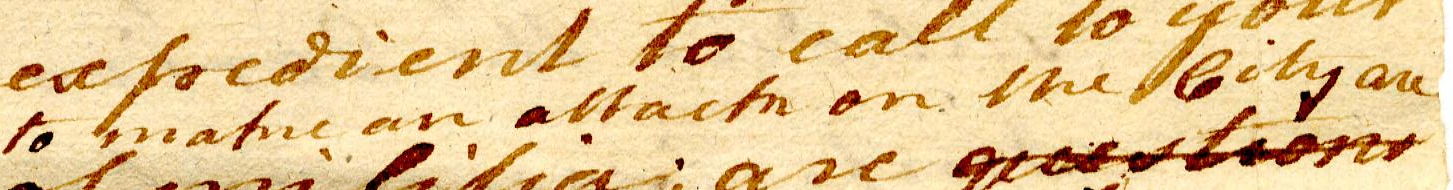to make an attack on the City are
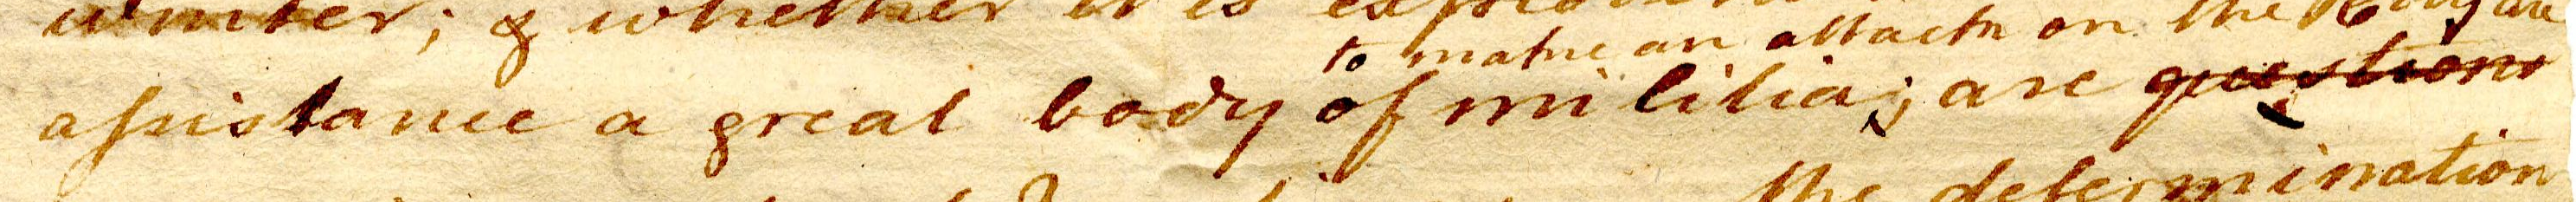assistance a great body of militia; are [questions]
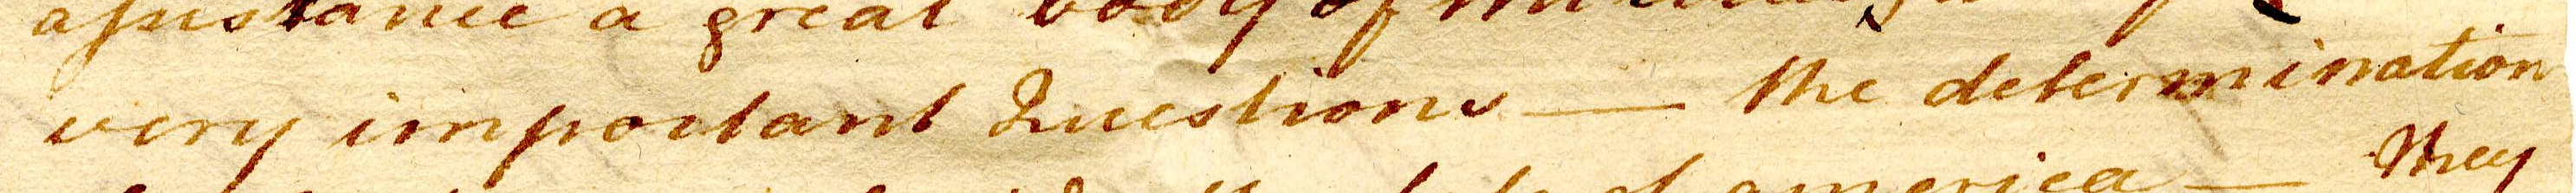very important Questions- the determination
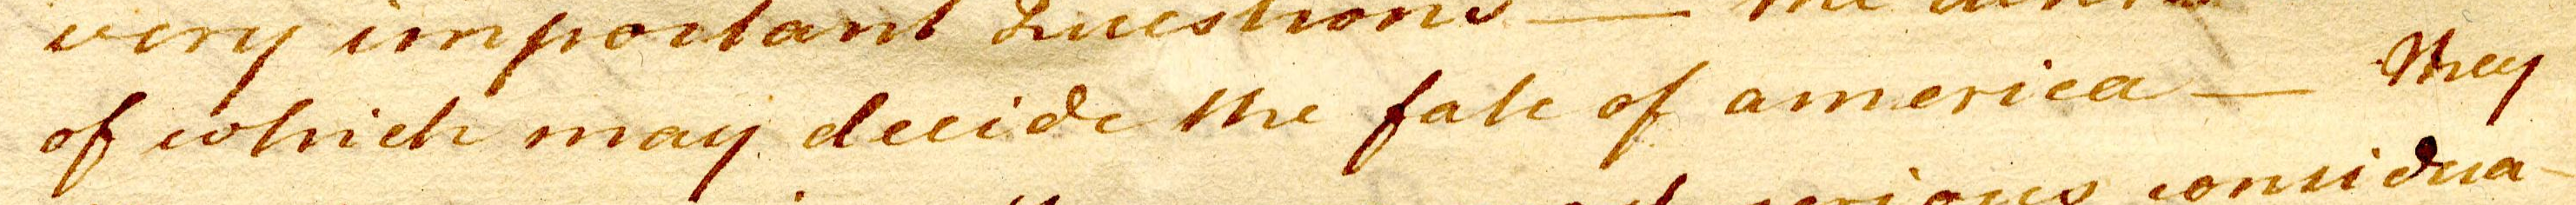of which may decide the fate of america- they
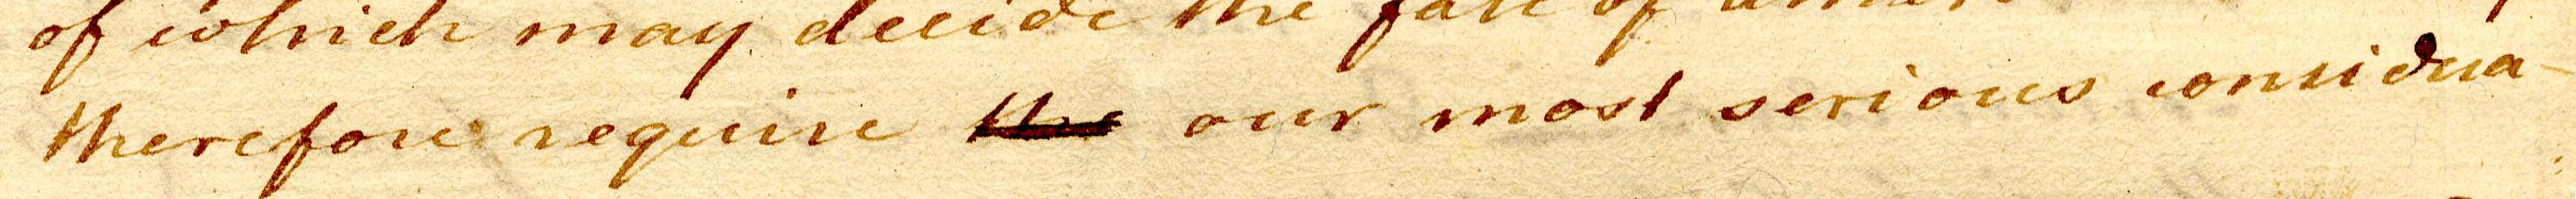therefore require [the] our most serious considera
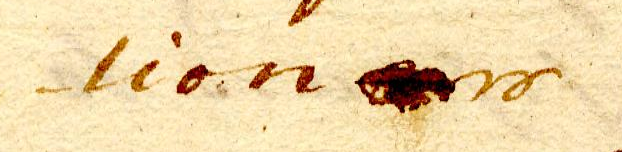-tion [__]
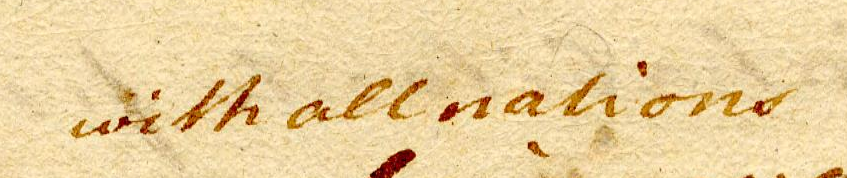with all nations
